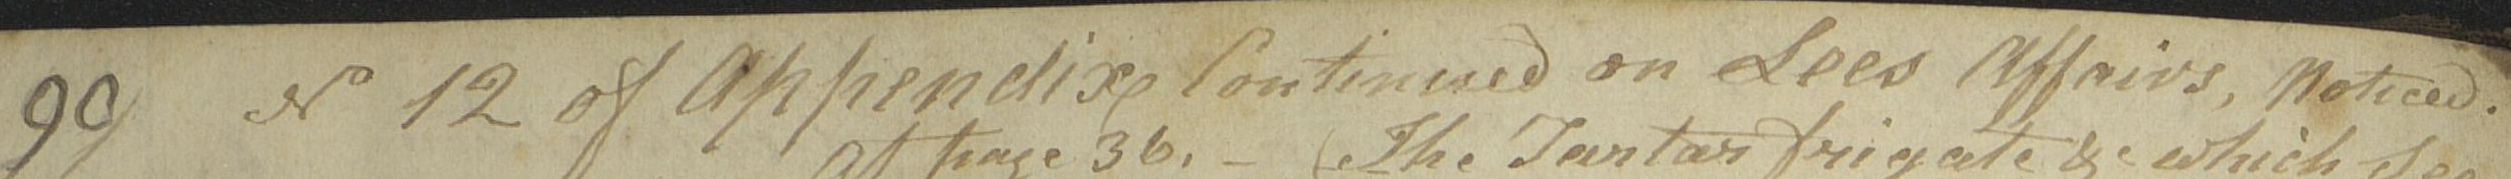90 N^o 12 of Appendix Continued on Lees Affairs, Noticed
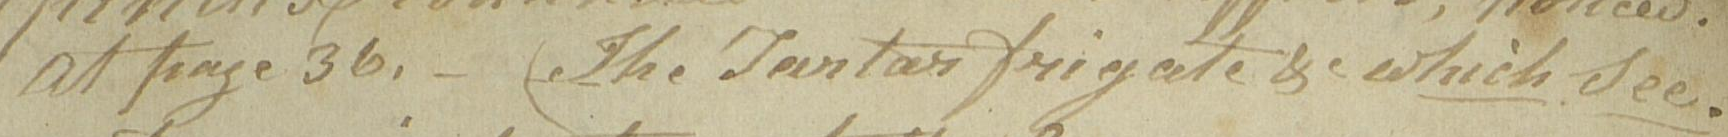at page 36. (The Tartar frigate &^c. which see.
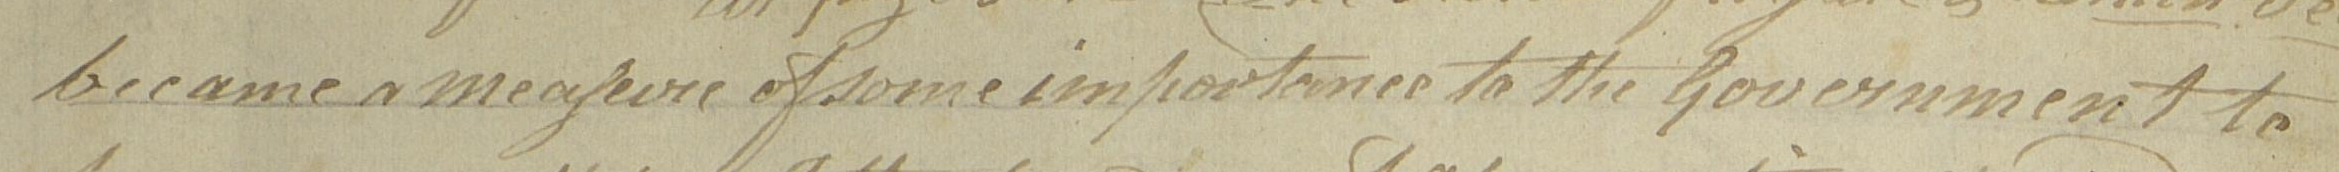became a measure of some importance to the Government to
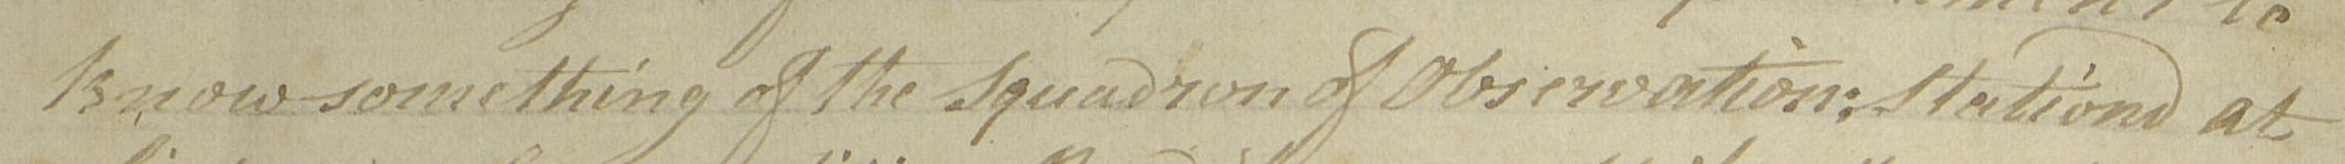know something of the squadron of Observation stationd at
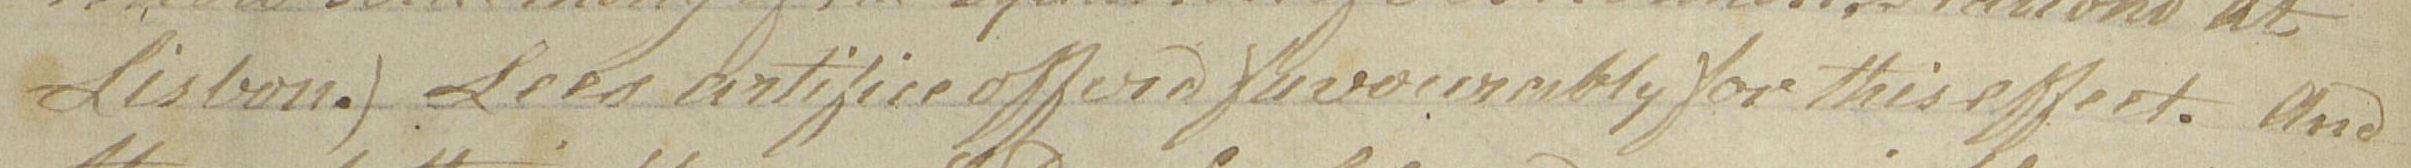Lisbon.) Lees Artifice offerd favourably for this effect. And
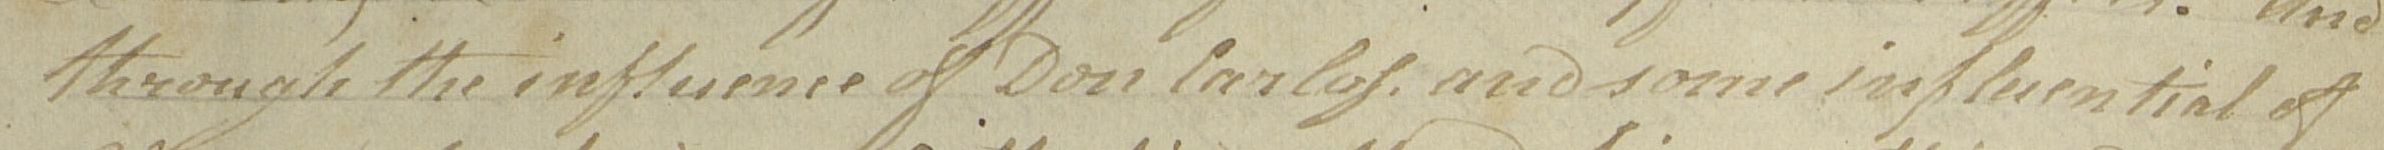through the influence of Don Carlos and some influential of
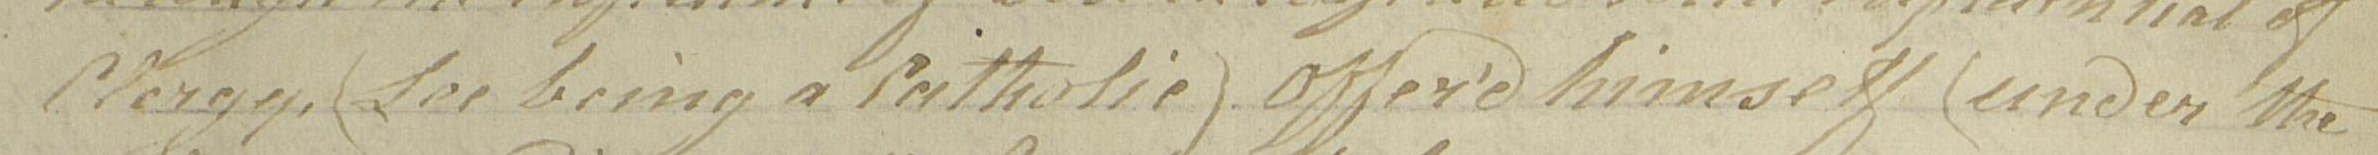Clergy, (Lee being a Catholic) Offer'd himself (under the
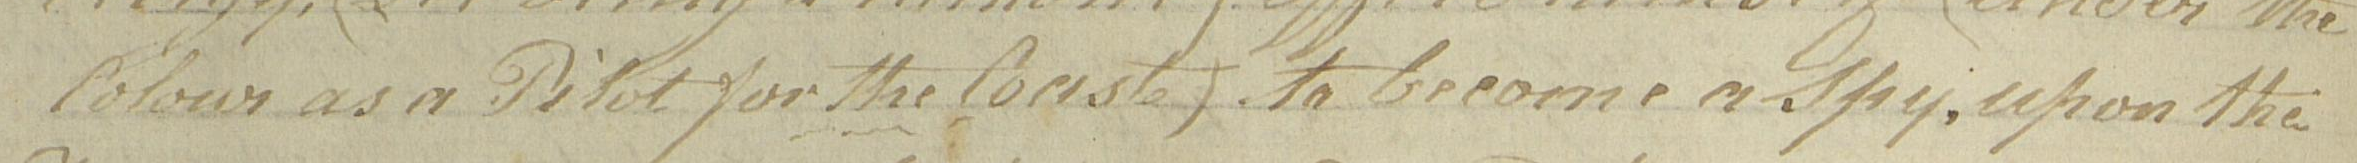Colour as a Pilot for the Coaste) to become a Spy, upon the
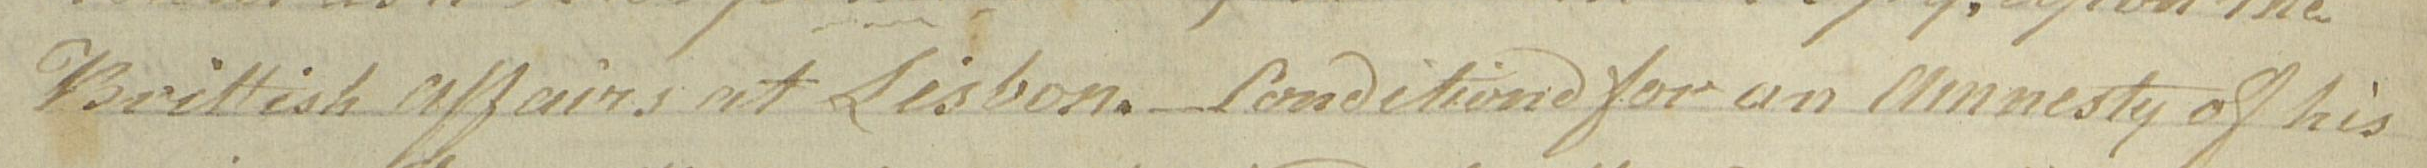Brittish Affairs at Lisbon. Conditioned for an Amnesty of his
